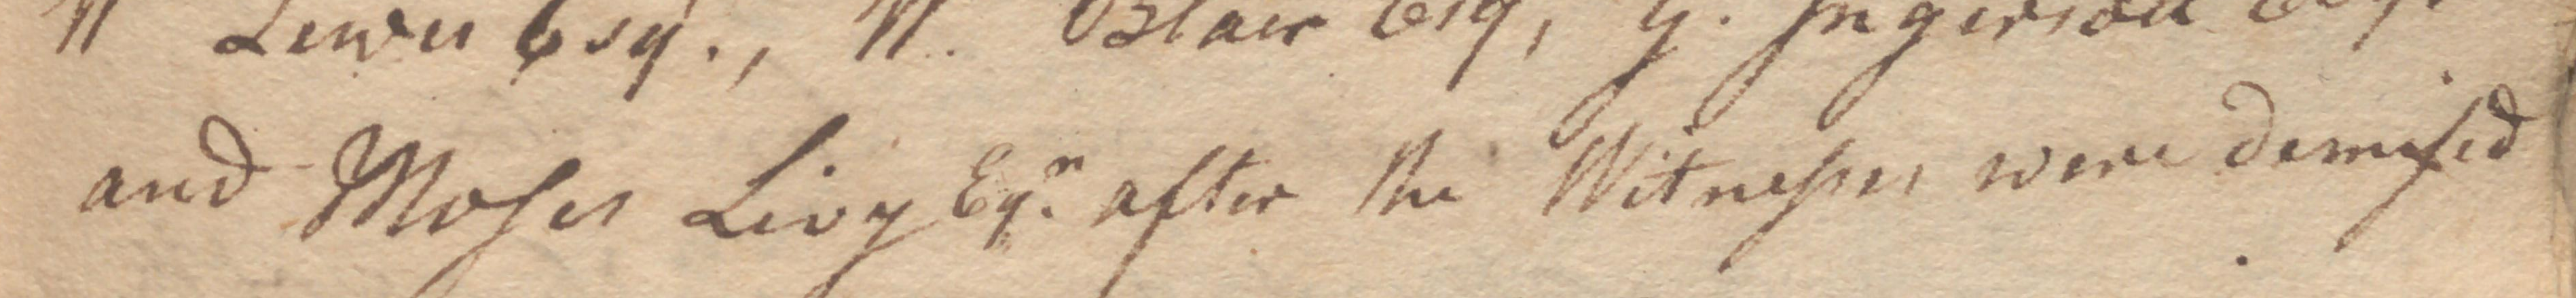and Moses Livy bq^r. after the Witnesses were demised
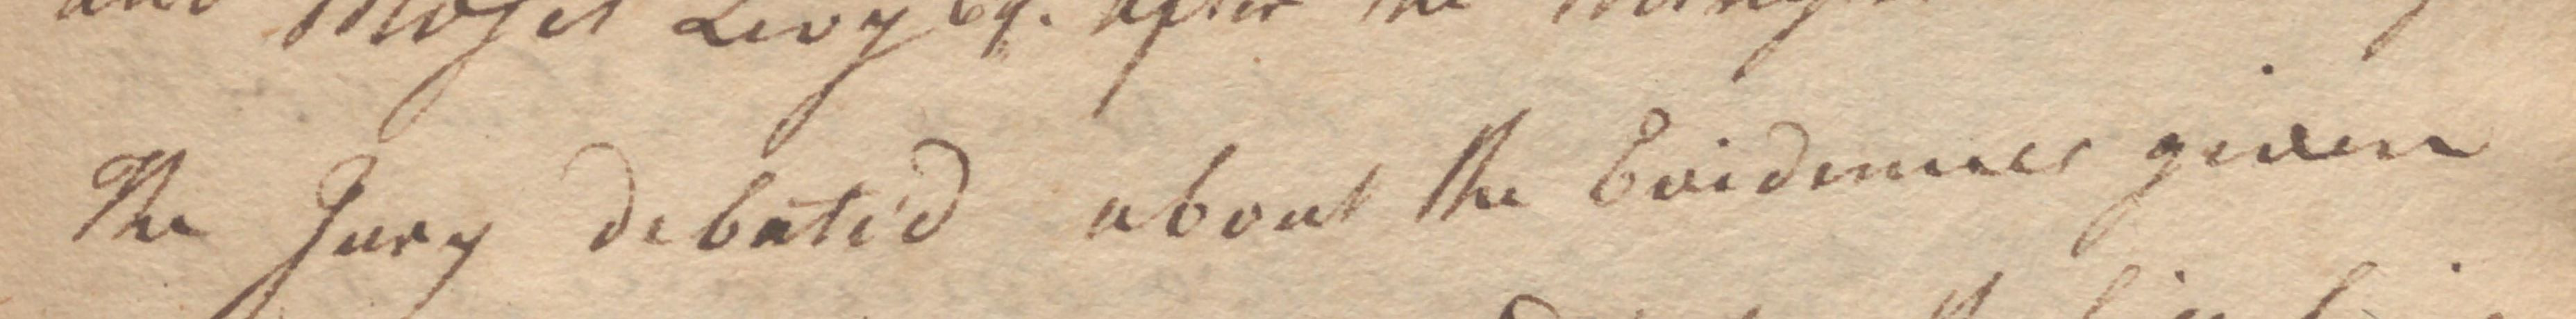The Jury debated about the Evidences given
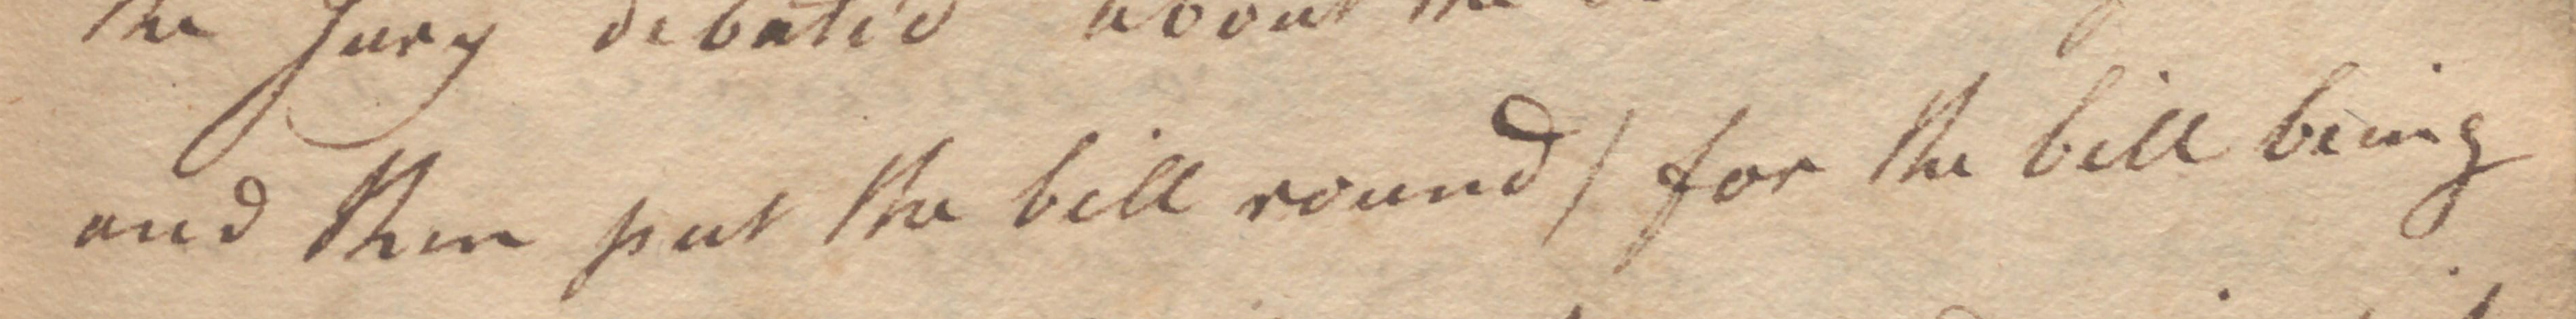and then put the bill round / for the bill being
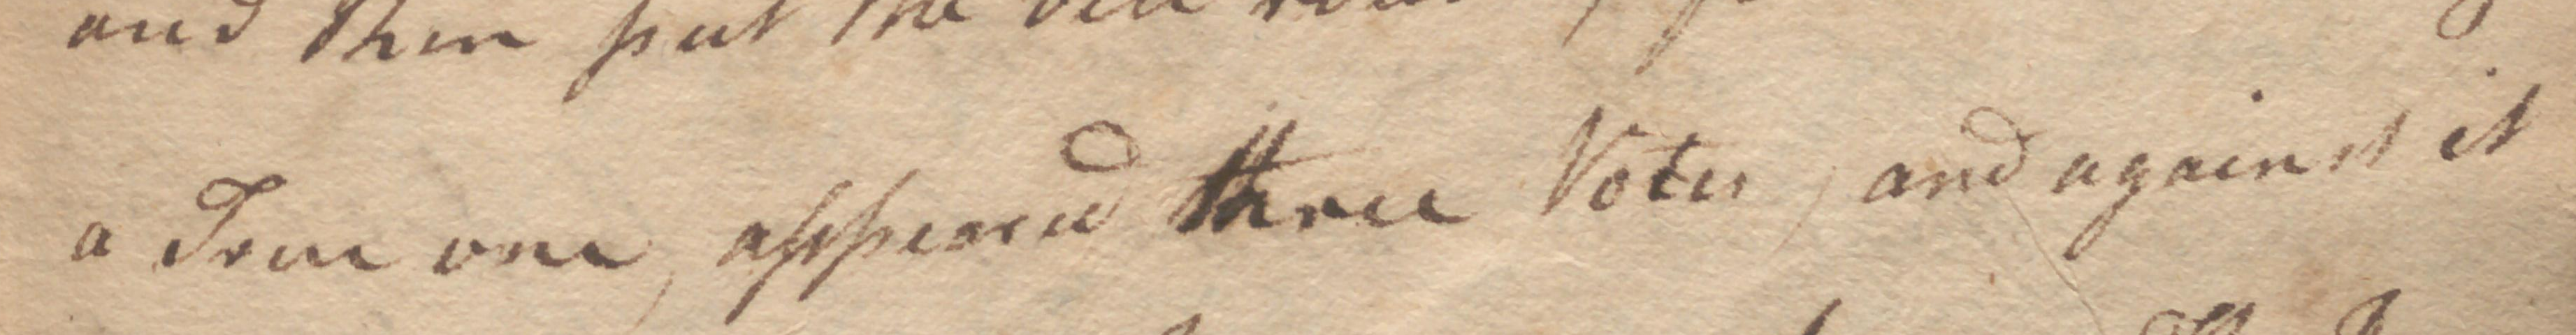a True one, appeared three Votes, and against it
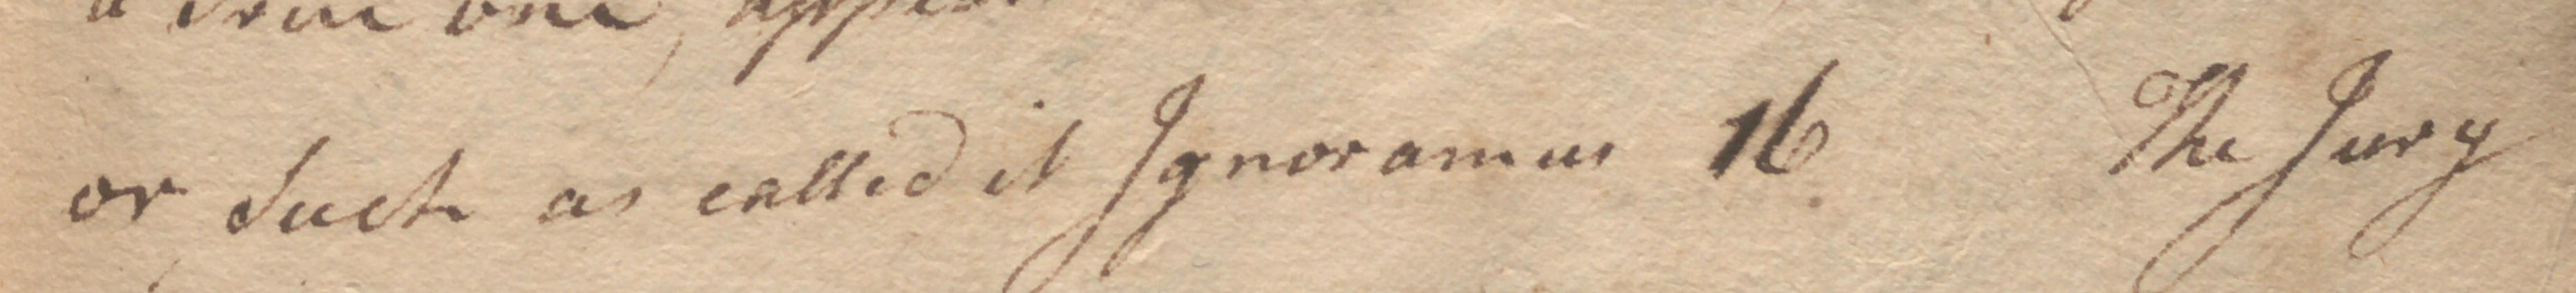or such as called it Ignoramus 16 The Jury
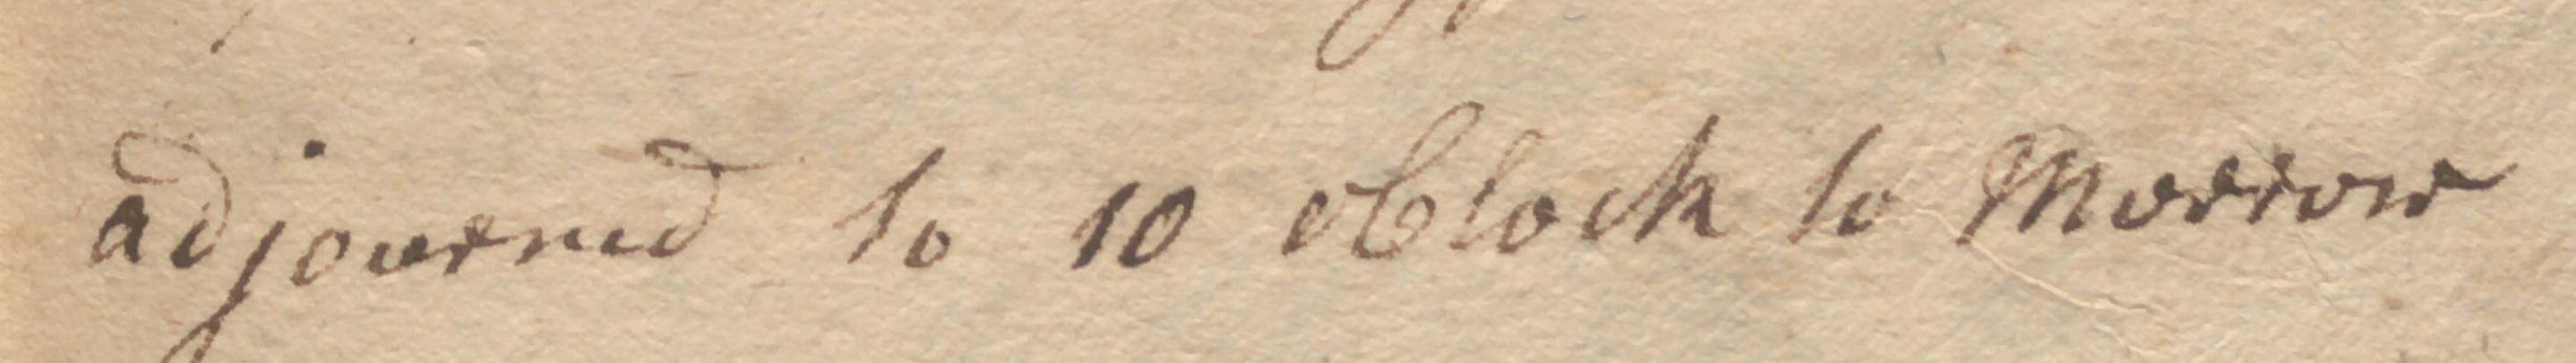adjourned to 10 oClock to Morrow
